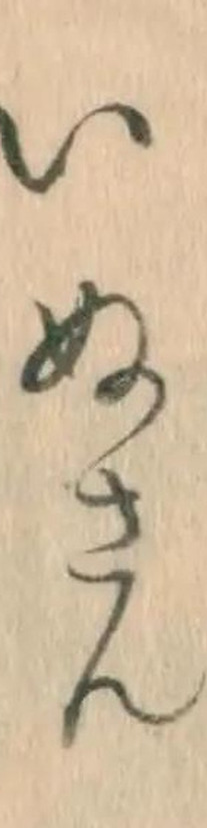いぬさん
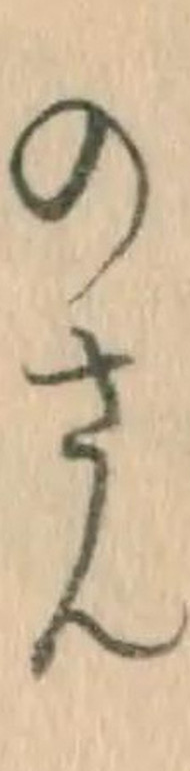のさん
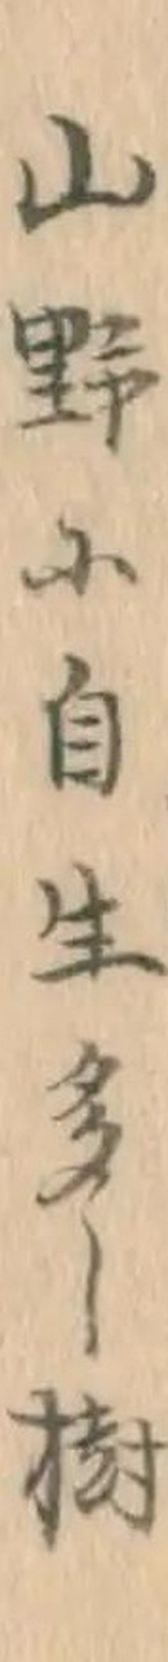山野に自生多し樹
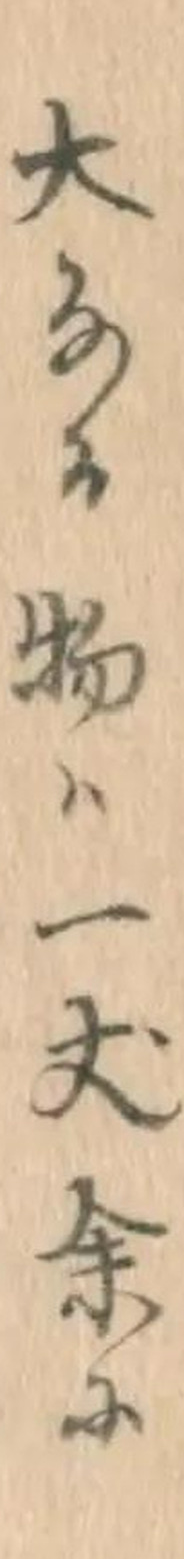大なる物は一丈余に
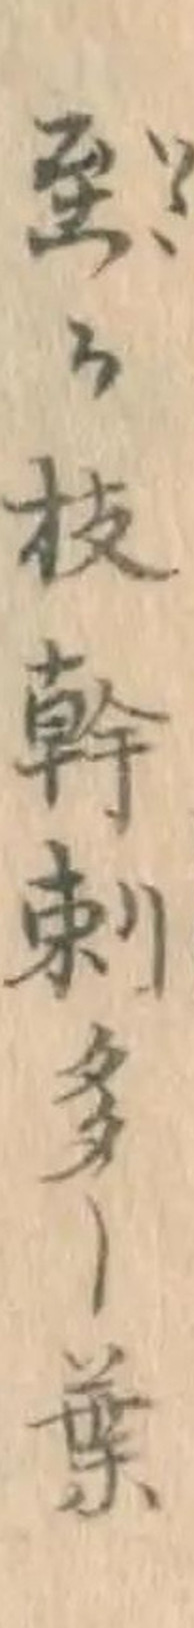至枝幹刺多し葉
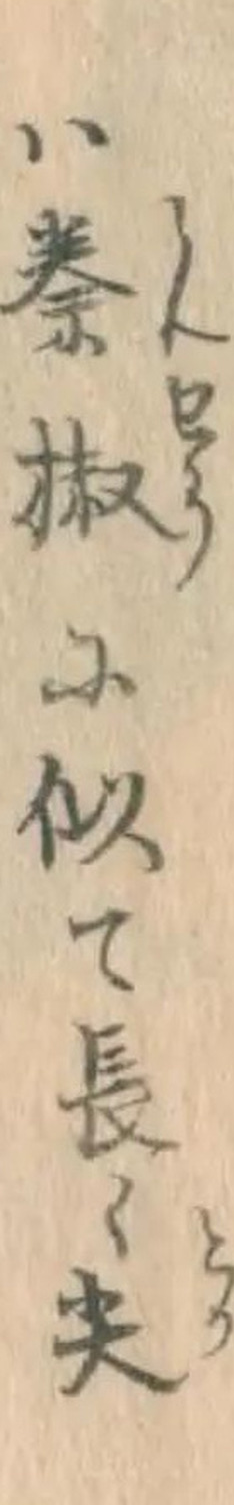は秦椒に似て長く突
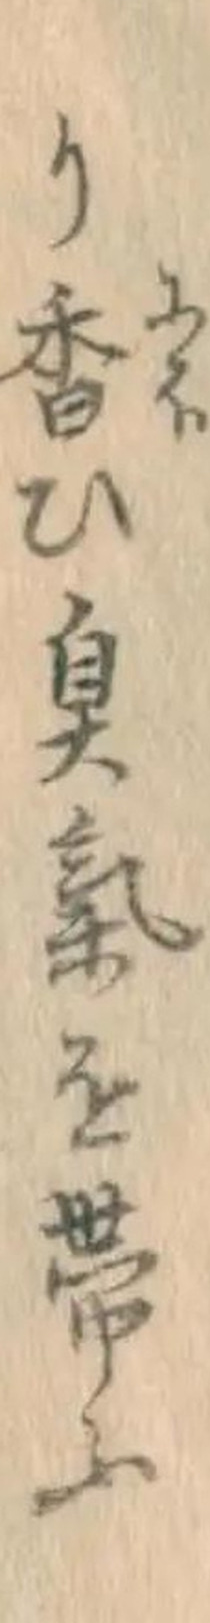り香ひ臭気を帯ふ
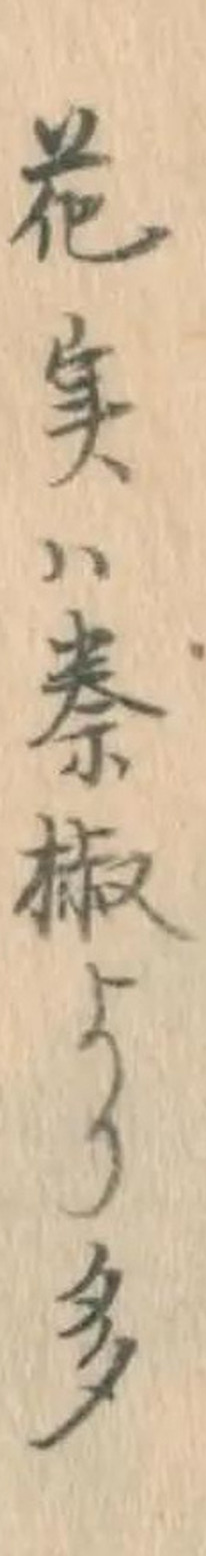花実は秦椒より多
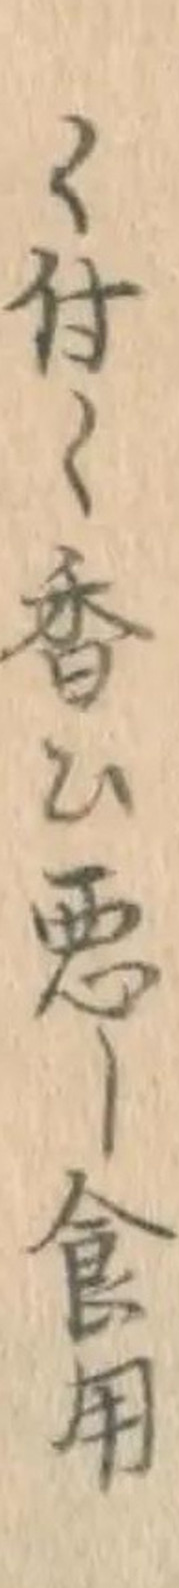く付く香ひ悪し食用
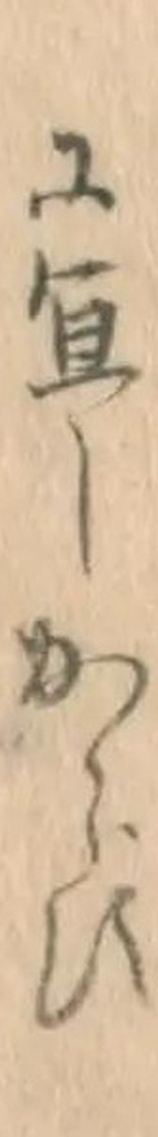に宜しからす

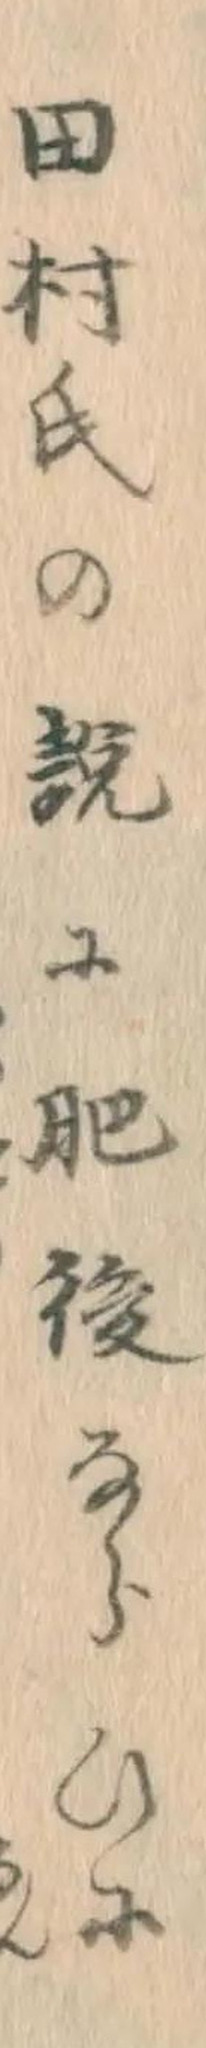田村氏の説に肥後ならひに
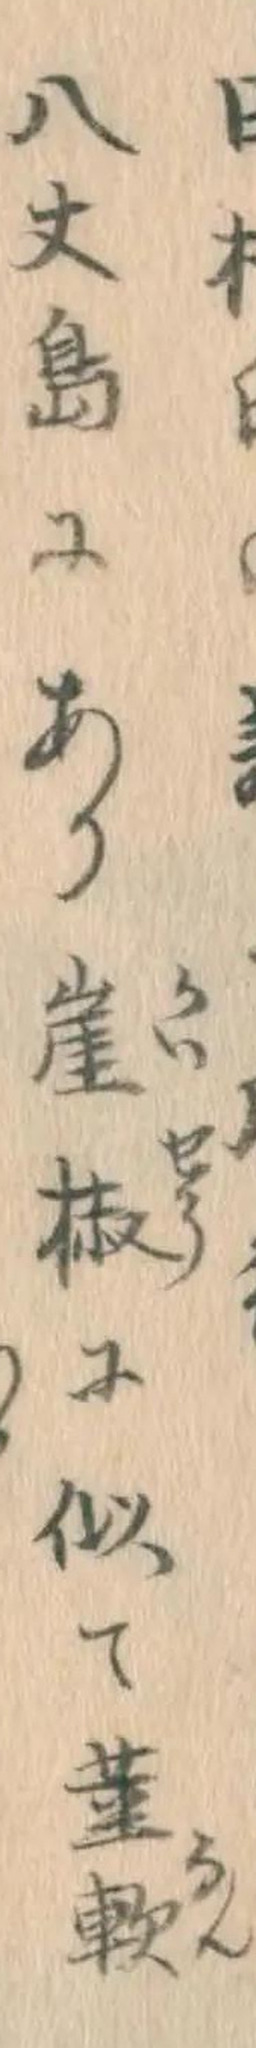八丈島にあり崖椒に似て茎軟
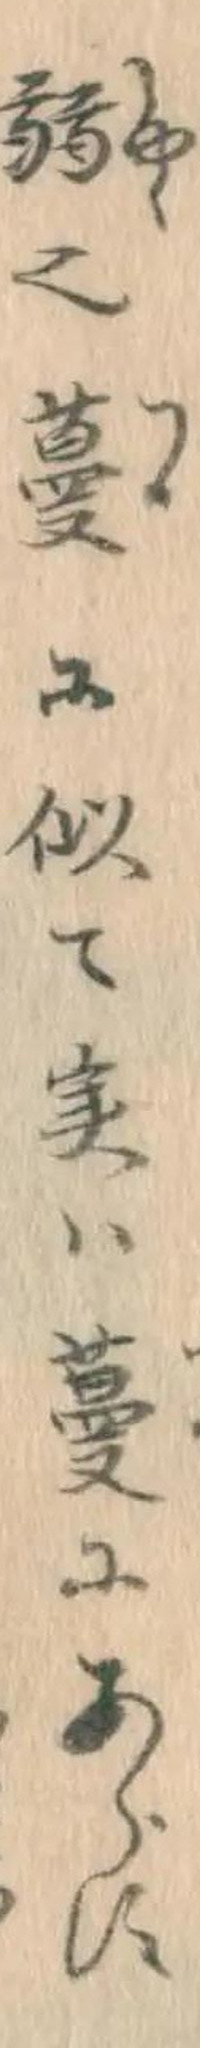弱也蔓に似て実は蔓にあらす
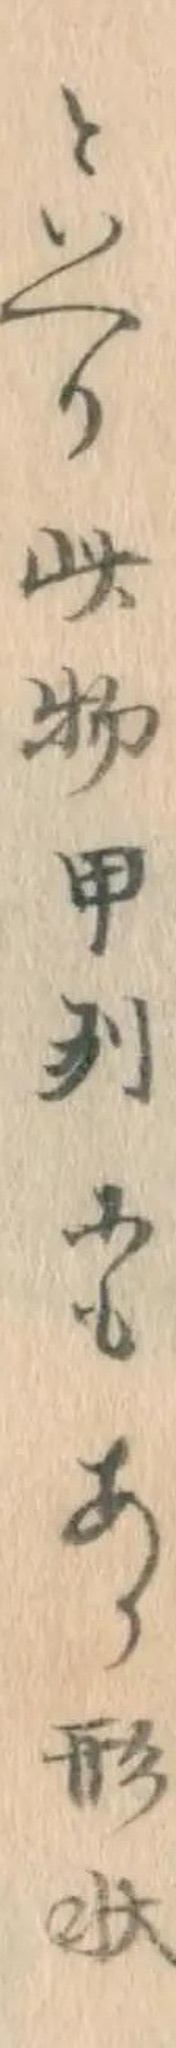といへり此物甲州にもあり形状
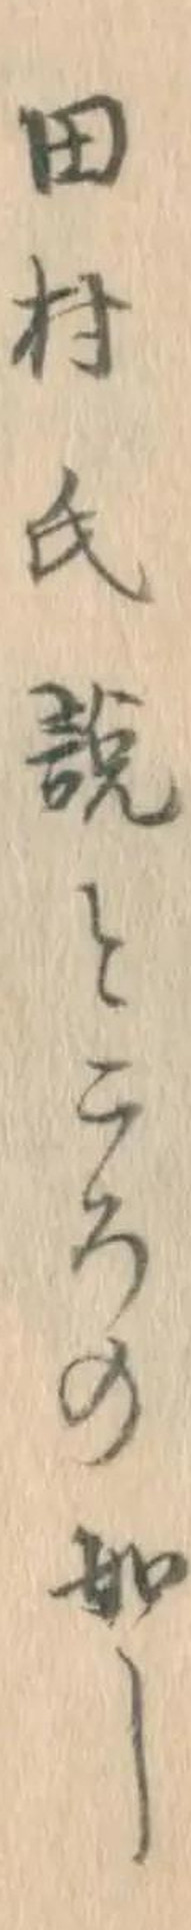田村氏説ところの如し

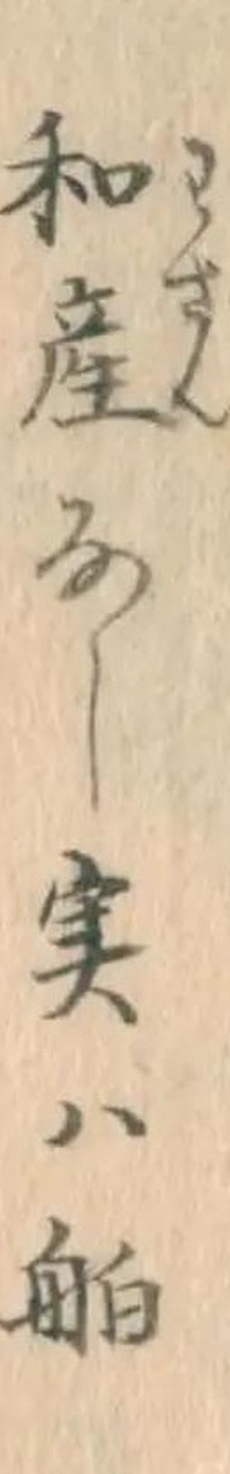和産なし実は舶
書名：本草図譜. 巻70-72
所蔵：国立国会図書館 National Diet Library, JAPAN
